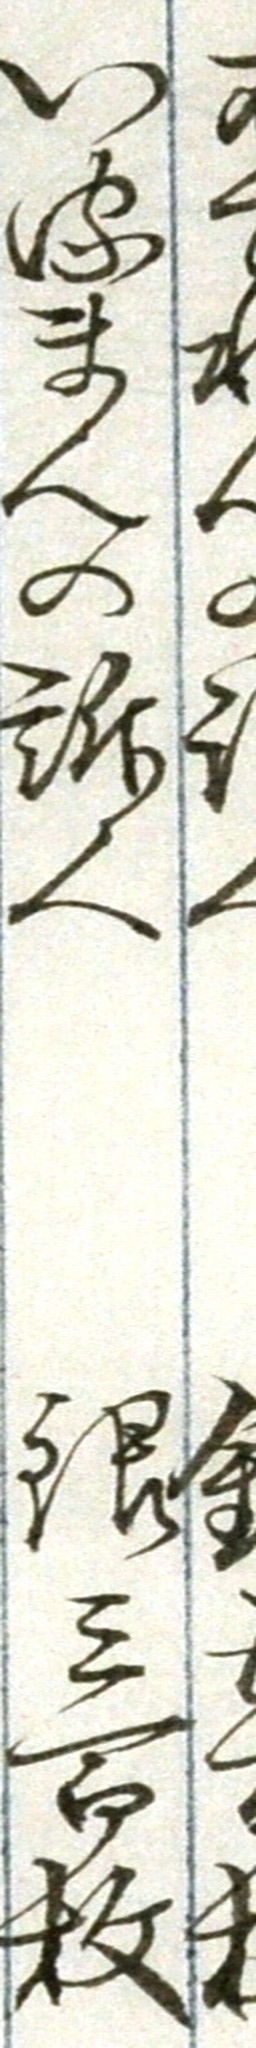いるまんの訴人銀三百枚
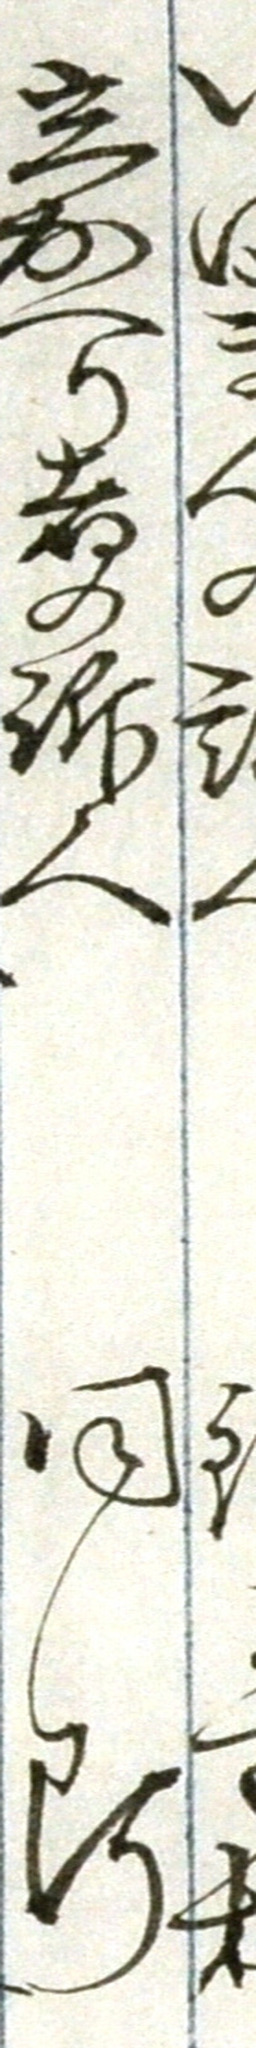立かへり者の訴人同断
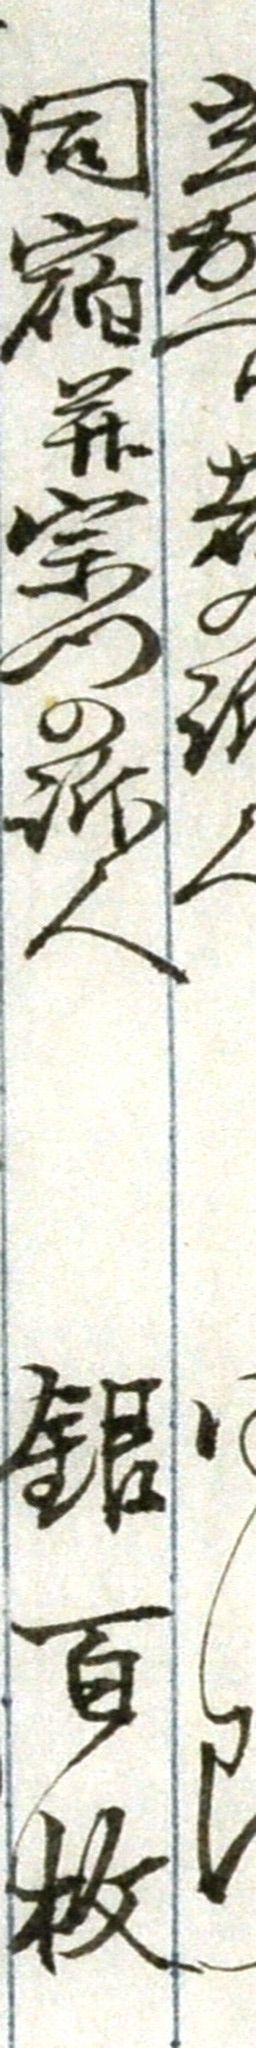同宿并宗門の訴人銀百枚
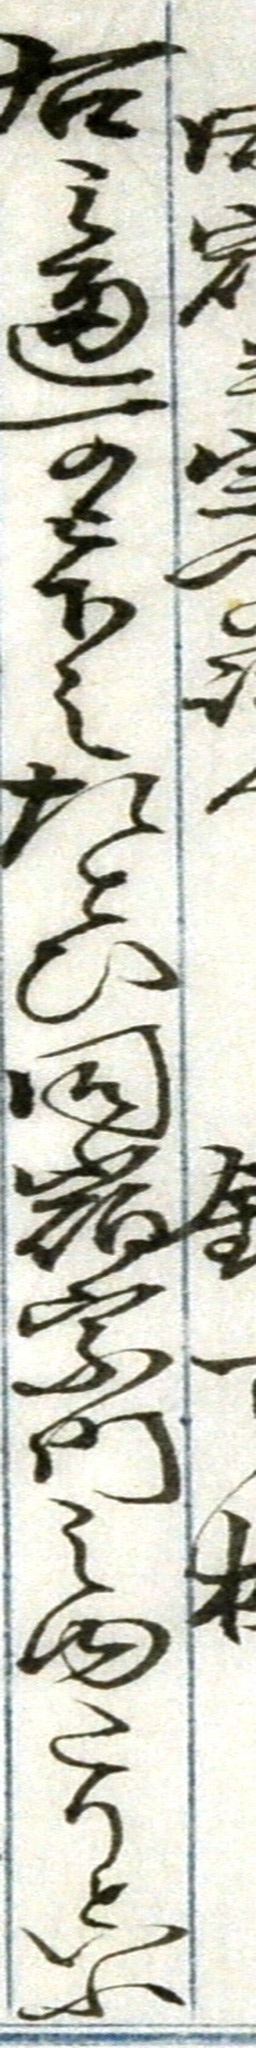右之通可被下之たとひ同宿宗門之内たりといふ
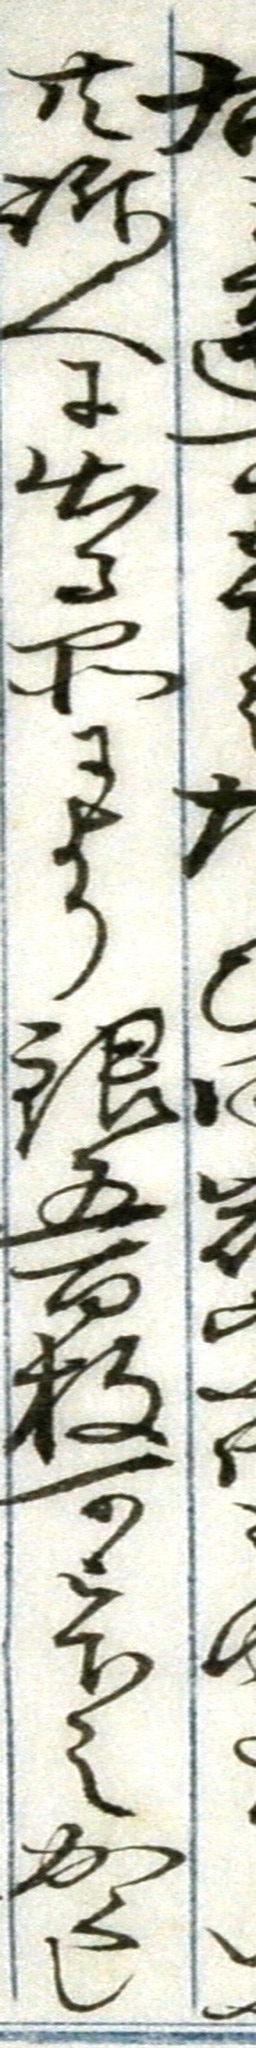共訴人に出る品により銀五百枚可被下之かくし
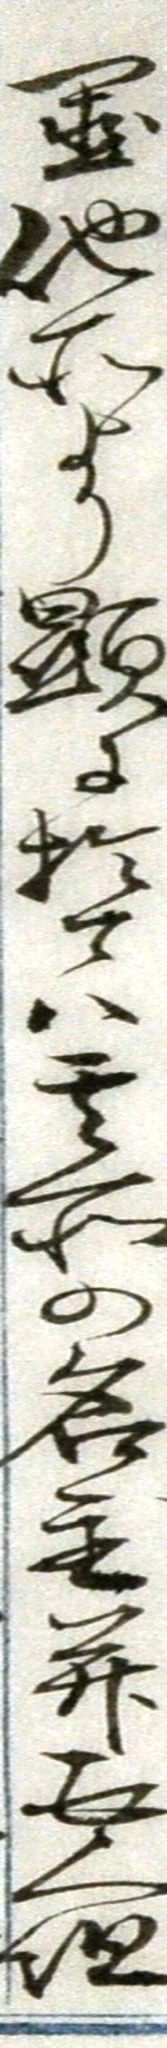置他所より顕に於てハ其所の名主并五人組
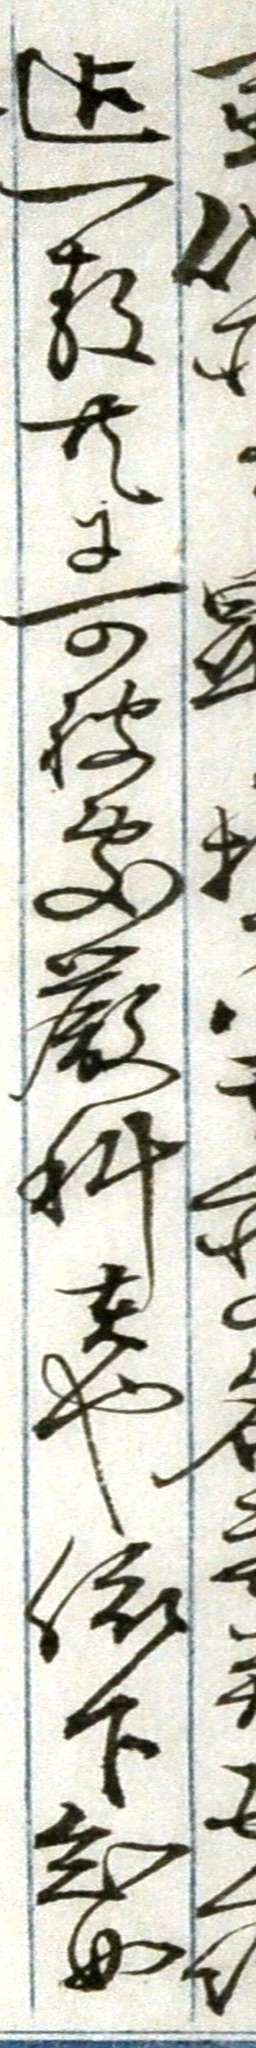迄一類共に可被処厳科者也依下知如

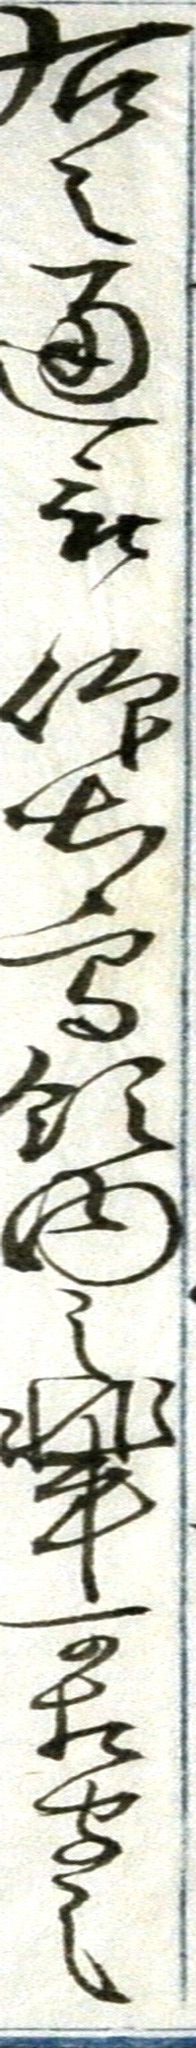右之通被仰出高領内之輩可相守之
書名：御高札之写
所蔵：伊那市立高遠町図書館・合同会社AMANE
